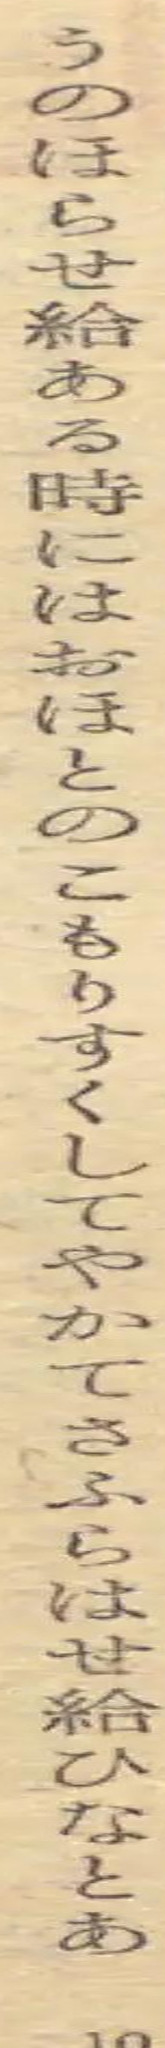うのほらせ給ある時にはおほとのこもりすくしてやかてさふらはせ給ひなとあ
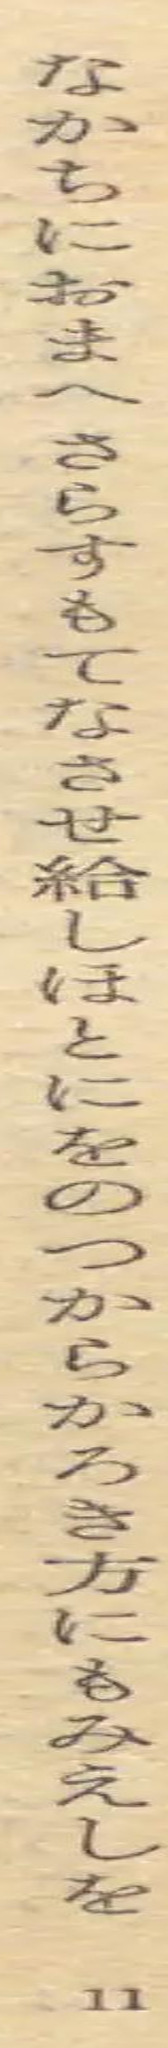なかちにおまへさらすもてなさせ給しほとにをのつからかろき方にもみえしを
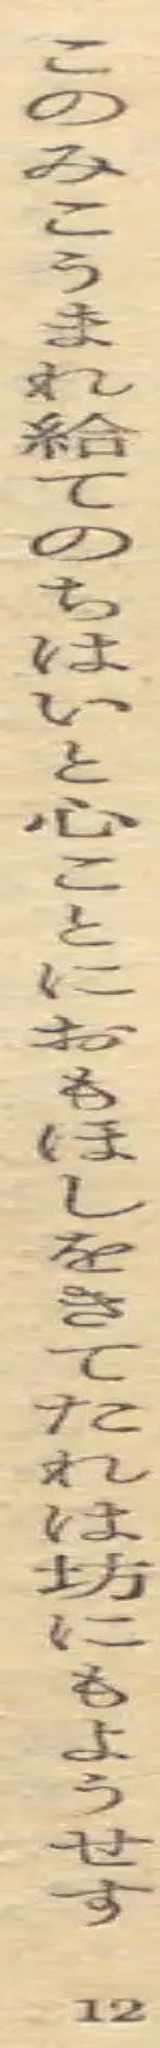このみこうまれ給てのちはいと心ことにおもほしをきてたれは坊にもようせす
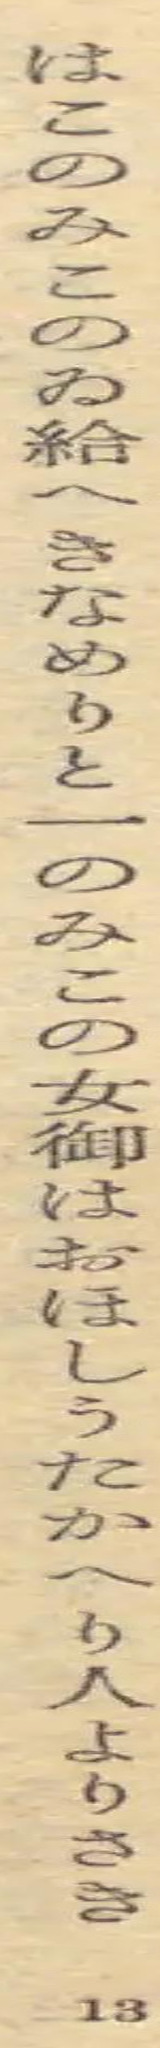はこのみこのゐ給へきなめりと一のみこの女御はおほしうたかへり人よりさき
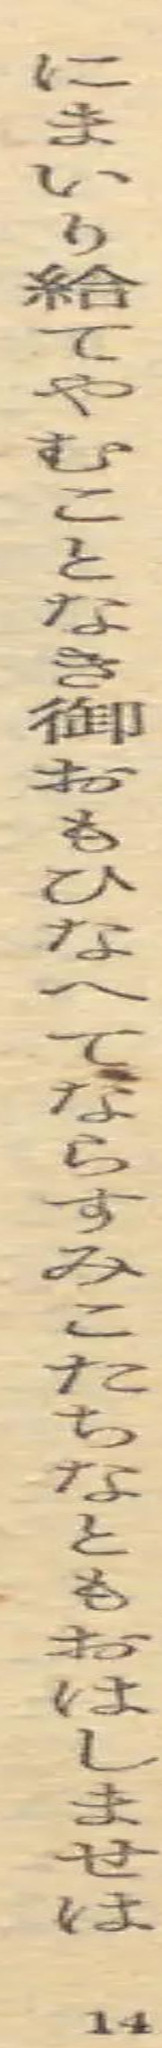にまいり給てやむことなき御おもひなへてならすみこたちなともおはしませは
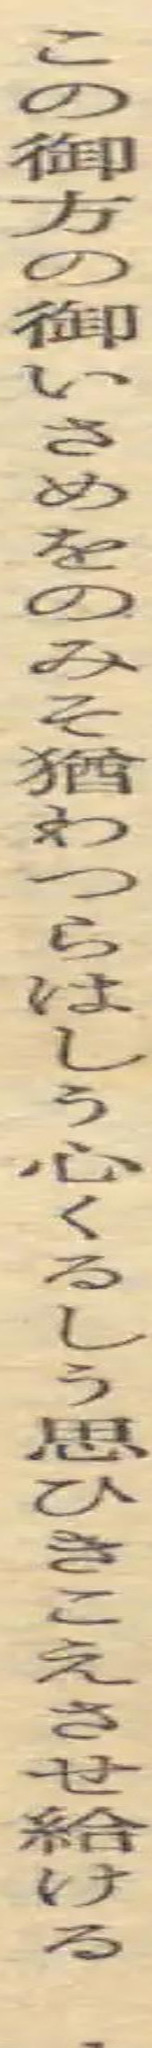この御方の御いさめをのみそ猶わつらはしう心くるしう思ひきこえさせ給ける
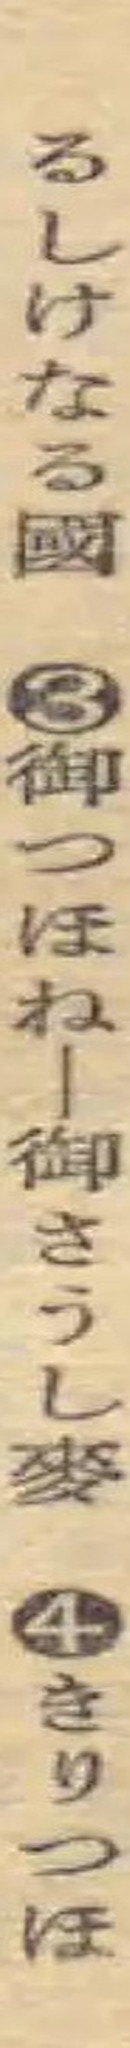るしけなる国❸御つほね―御さうし麦❹きりつほ
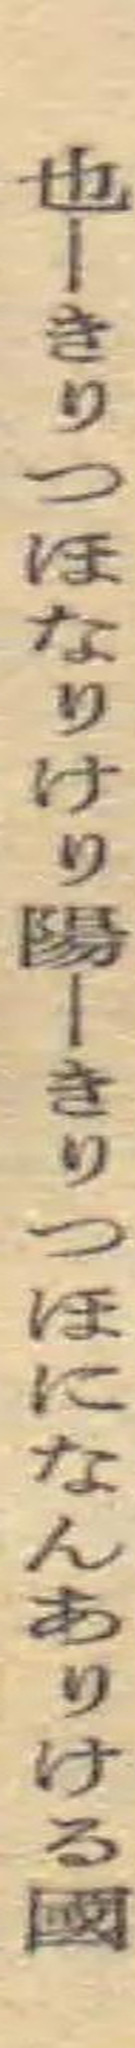也―きりつほなりけり陽―きりつほになんありける陽
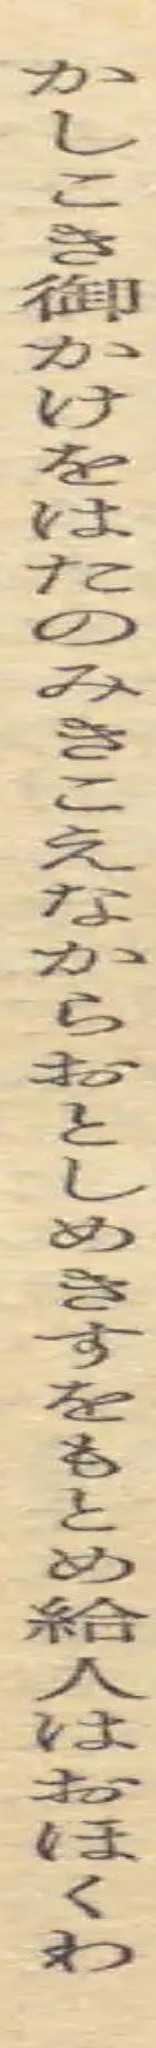かしこき御かけをはたのみきこえなからおとしめきすをもとめ給人はおほくわ
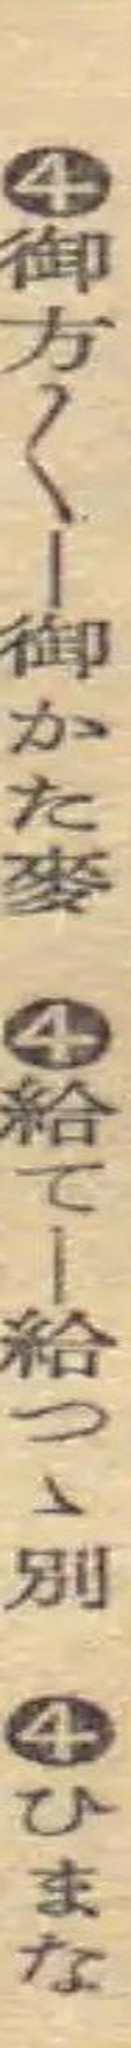❹御方〳〵―御かた麦❹給て―給つゝ別❹ひまな
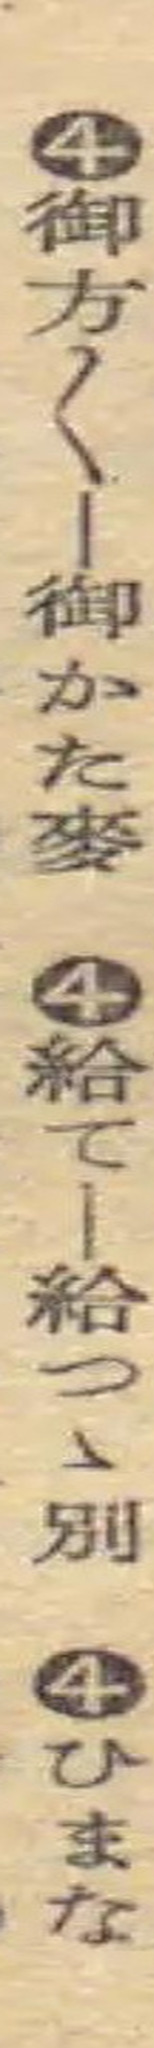❹御方〳〵―御かた麦❹給て―給つゝ別❹ひまな
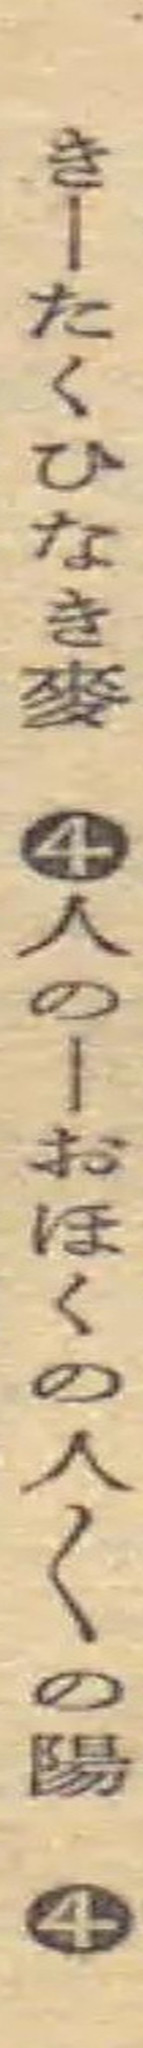き―たくひなき麦❹人の―おほくの人〳〵の陽❹
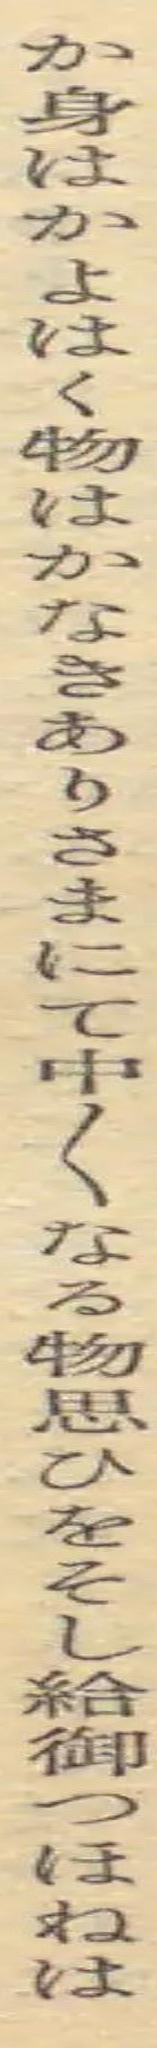か身はかよはく物はかなきありさまにて中〳〵なる物思ひをそし給御つほねは
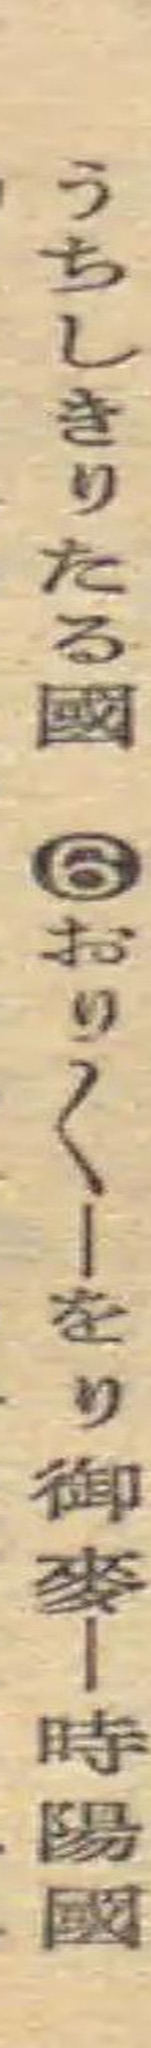うちしきりたる国❻おり〳〵―をり御麦―時陽国
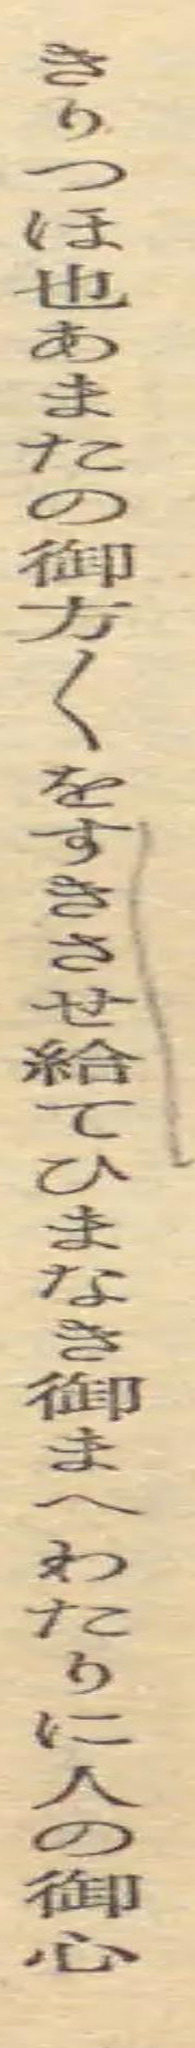きりつほ也あまたの御方〳〵をすきさせ給てひまなき御まへわたりに人の御心
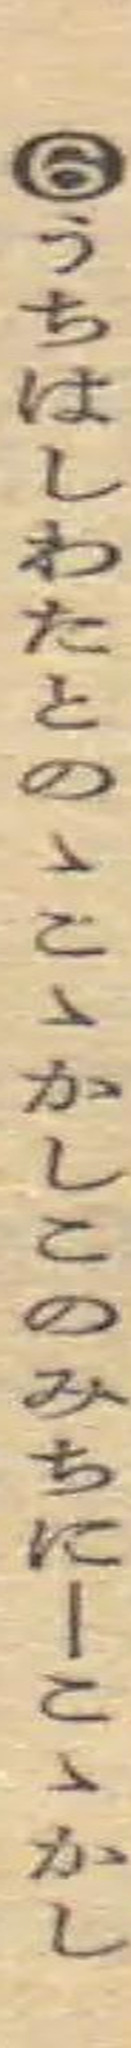❻うちはしわたとのゝこゝかしこのみちに―こゝかし
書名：校異源氏物語.
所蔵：国立国会図書館 National Diet Library, JAPAN
